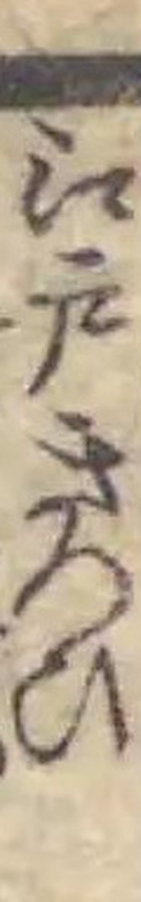江戸きつひ
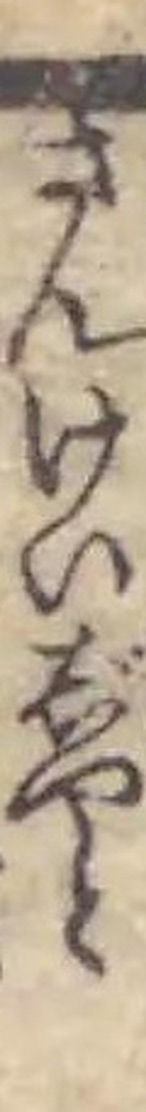さんけいじやと
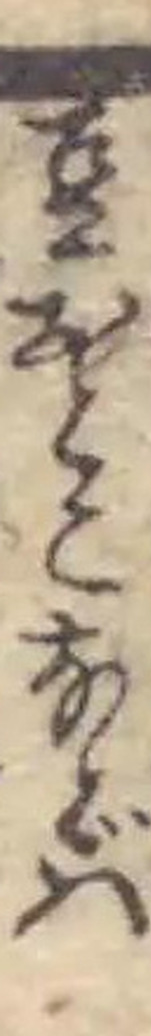豆おとこなどハ
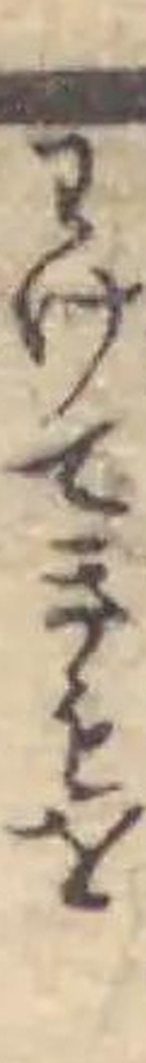わけてきもを
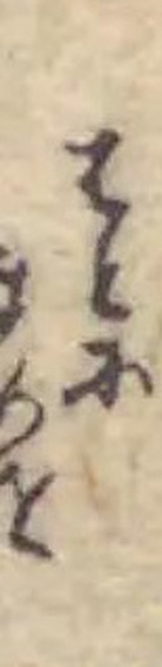はとに
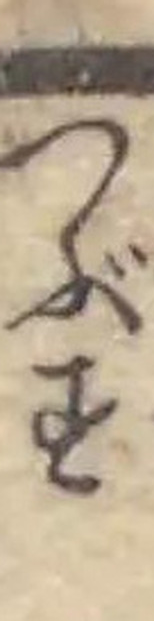つぶす
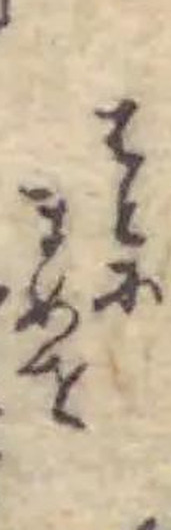はとに
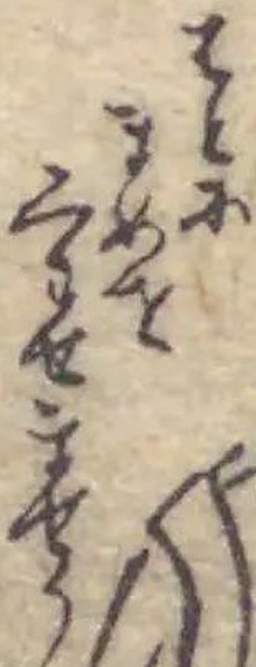くわせませう
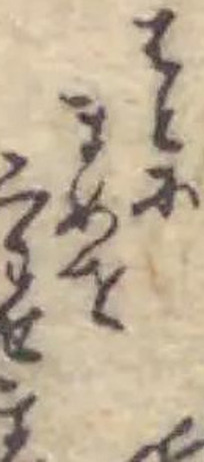まめを
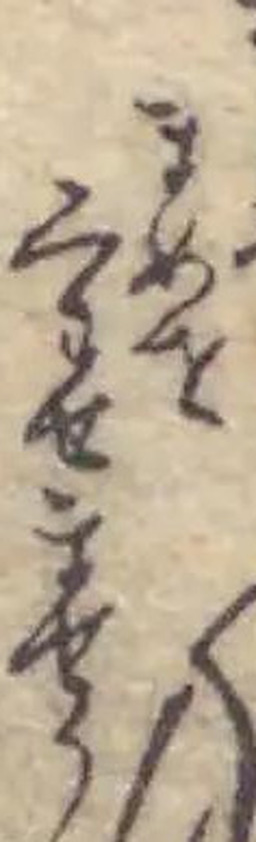くわせませう
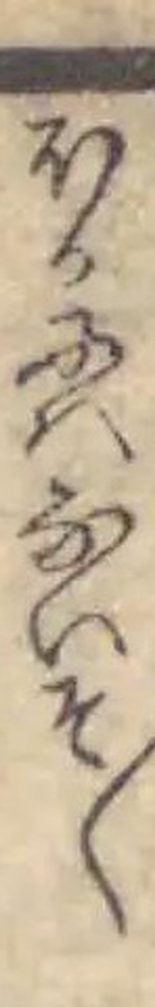ほかにハないそ〳〵

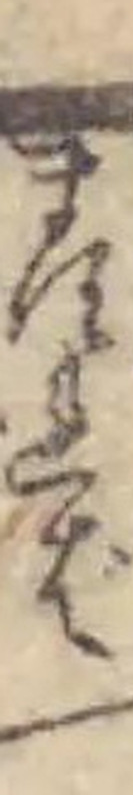さすれば
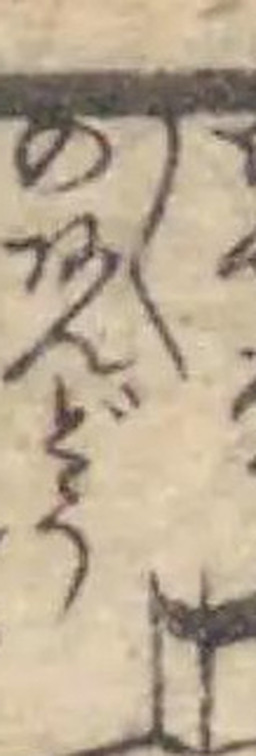のあんどう
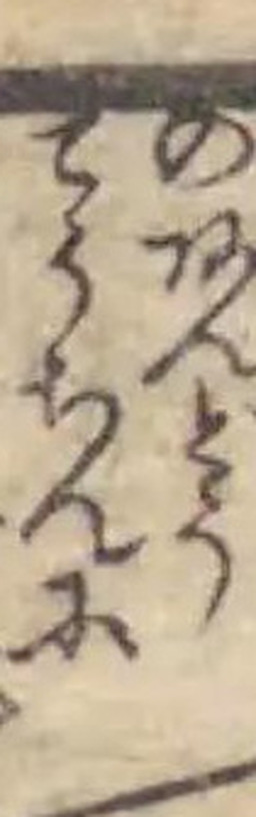てうちんに
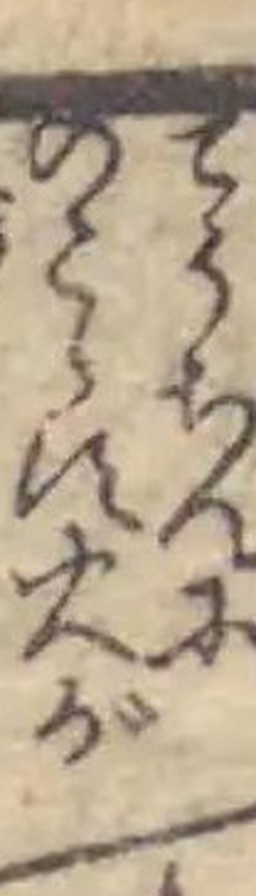のこらす火が
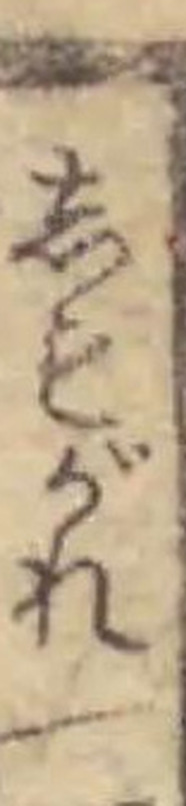しもがれ
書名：豆男江戸見物 2巻
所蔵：国立国会図書館 National Diet Library, JAPAN
